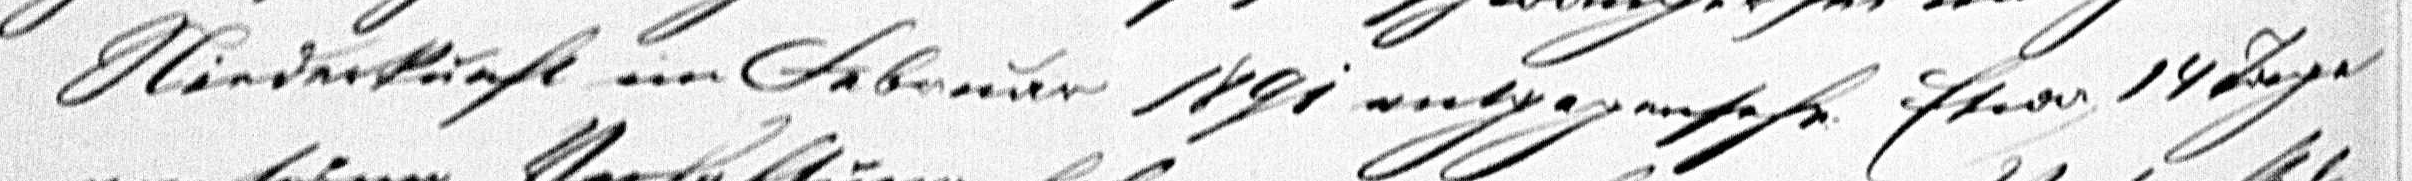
Niederkunft im February 1891 entgegensehe. Etwa 14 Tage
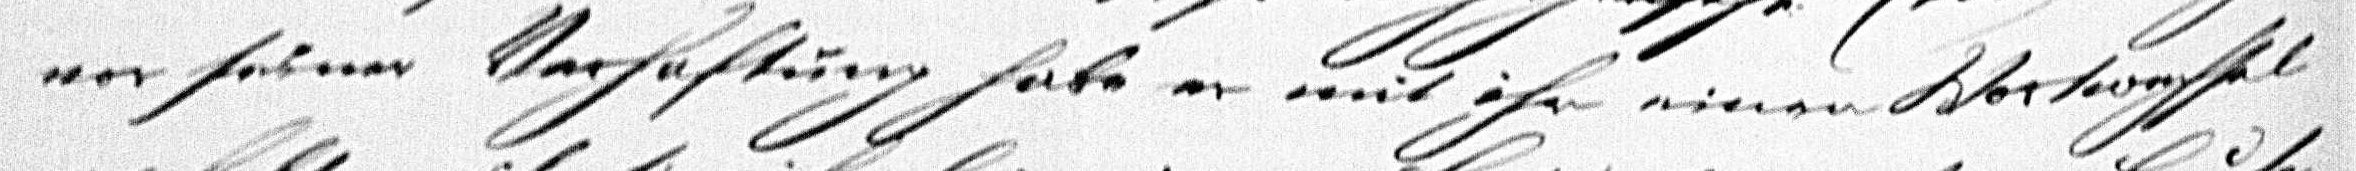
vor seiner Verhaftung habe er mit ihr einen Wortwechsel
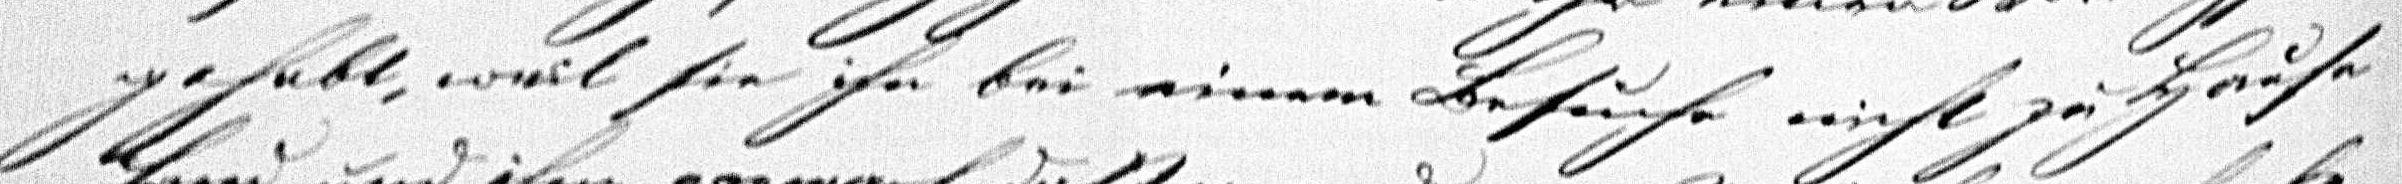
gehabt, weil sie ihn bei einem Besuche nicht zu Hause
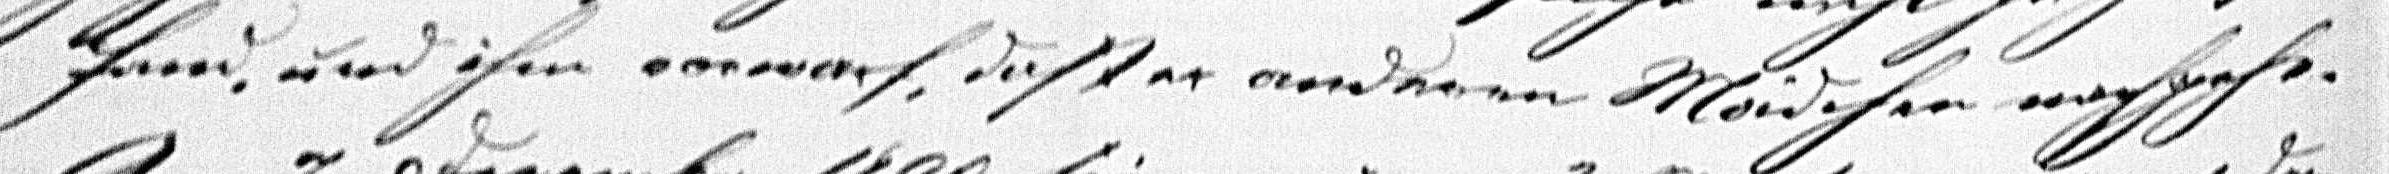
fand, und ihm vorwarf, daß er anderen Mädchen nachgehe.
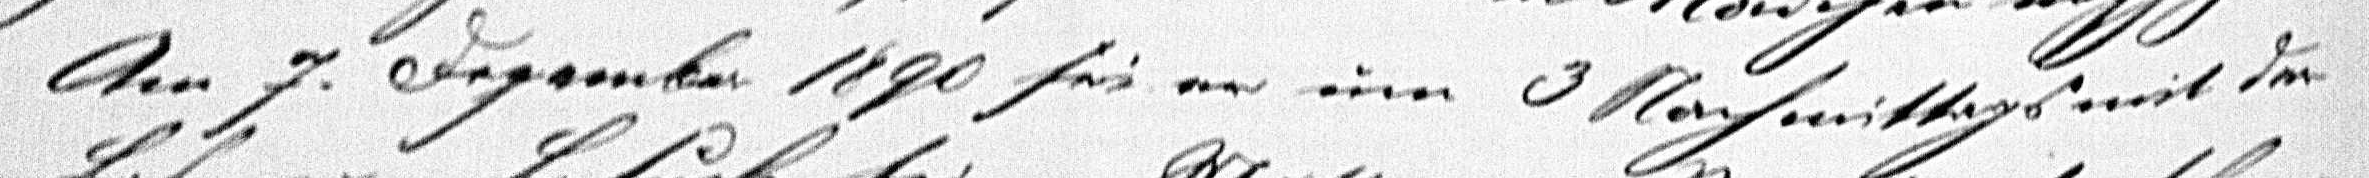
Am 7. Dezember 1890 sei er um 3 Nachmittags mit der
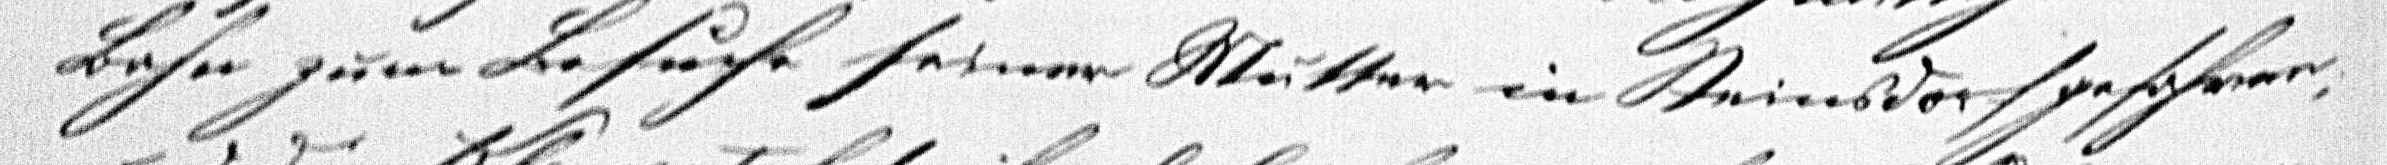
Bahn zum Besuch seiner Mutter in Steinsdorf gefahren,
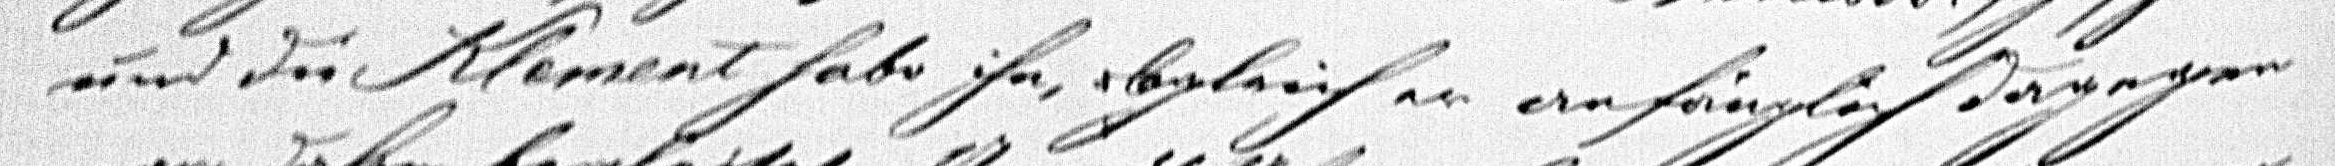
und die Klement habe ihn, obgleich er anfänglich dagegen
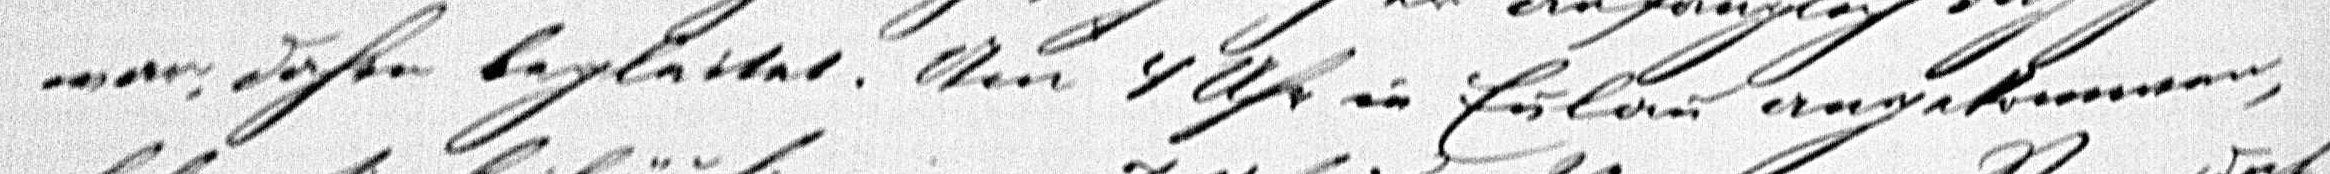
war, dahin begleitet. Am 4 Uhr in Eulau angekomment
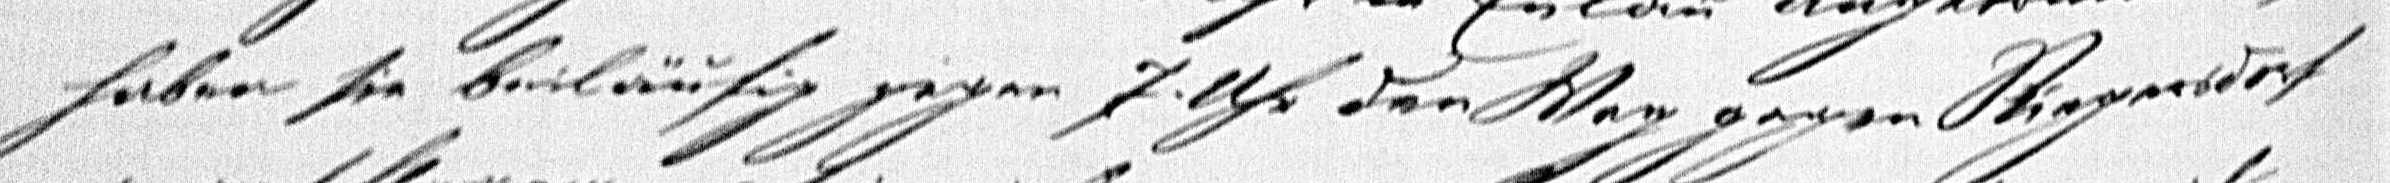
haben sie beiläufig gegen 7 Uhr den Weg gegen Riegersdorf
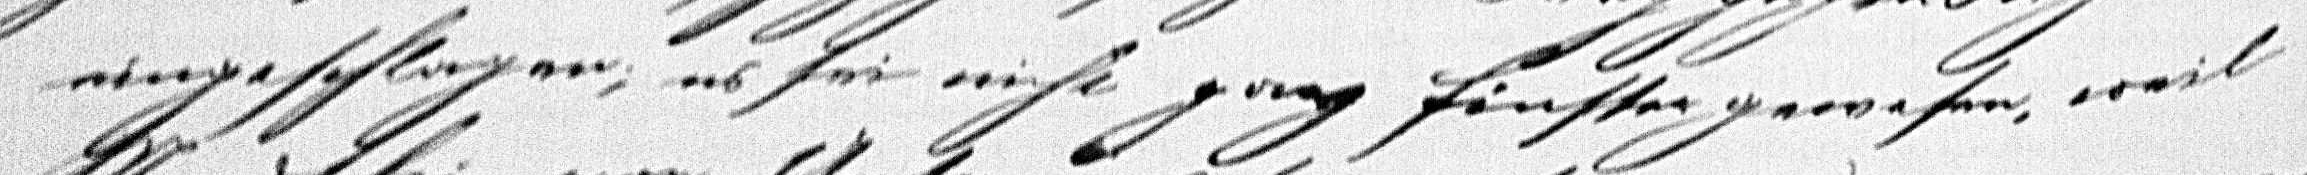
eingeschlagen, es sei nicht ganz finster gewesen, weil
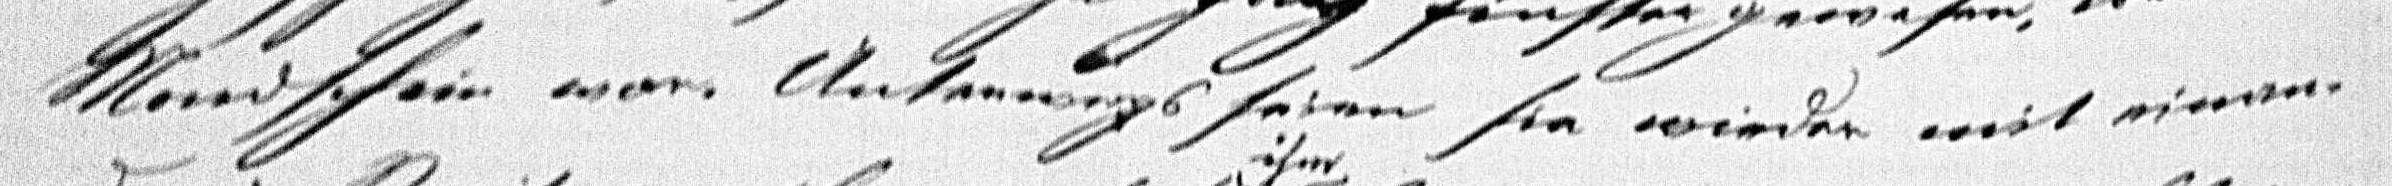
Mondschein war. Unterwegs seien sie wieder mit einan¬
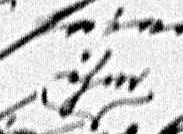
ihm
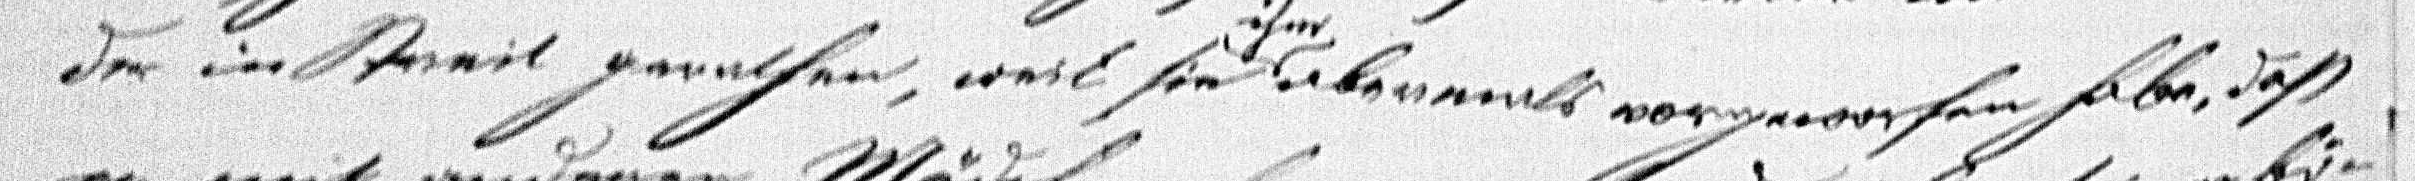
der in Streit gerathen, weil sie abermals vorgeworfen habe, daß
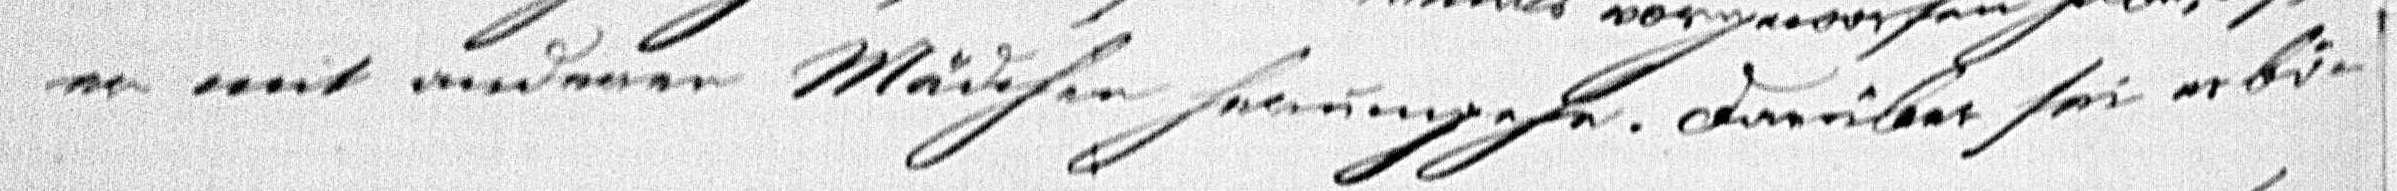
er mit anderer Mädchen herumgehe. Darüber sei er bö¬
